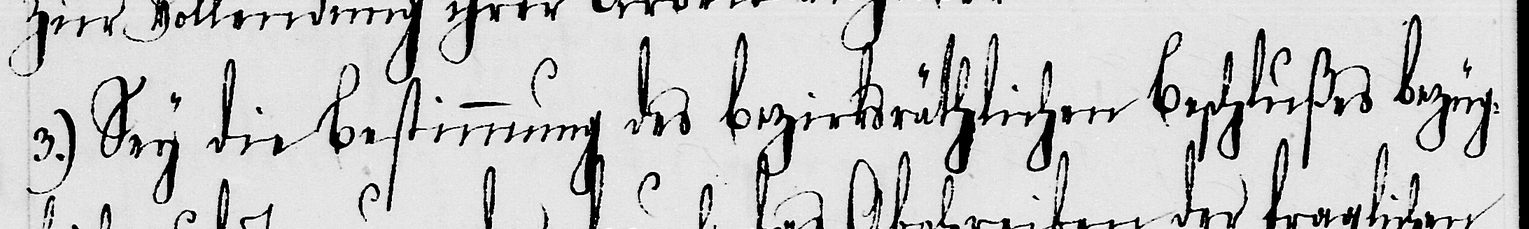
3.) Sey die Bestimmung des bezirksräthlichen Beschlußes bezüg¬
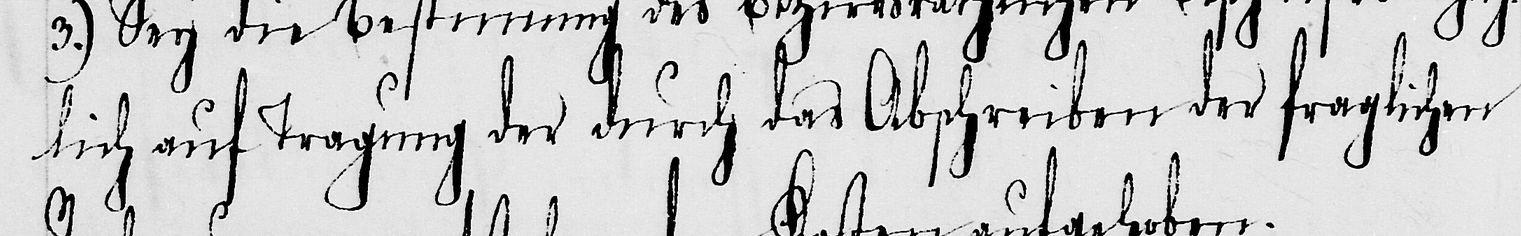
lich auf Tragung der durch das Abschreiben der fraglichen
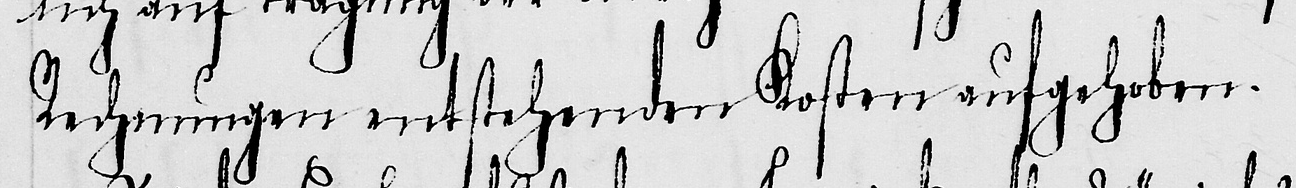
Rechnungen entstehenden Kosten aufgehoben.
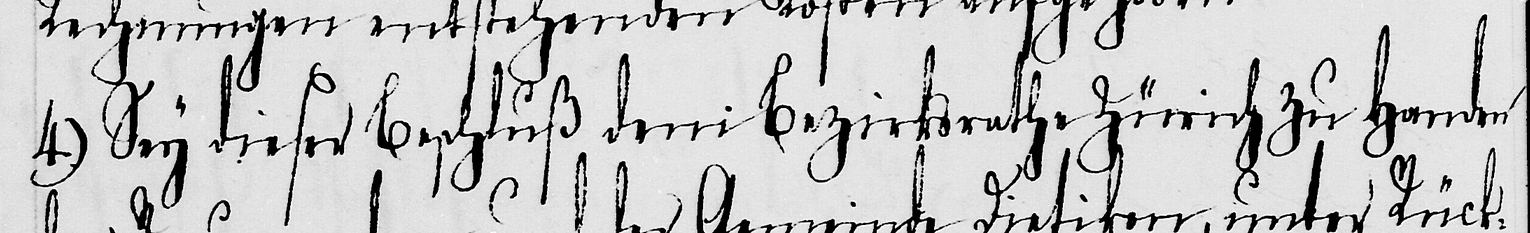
4.) Sey dieser Beschluß dem Bezirksrathe Zürich zu Handen
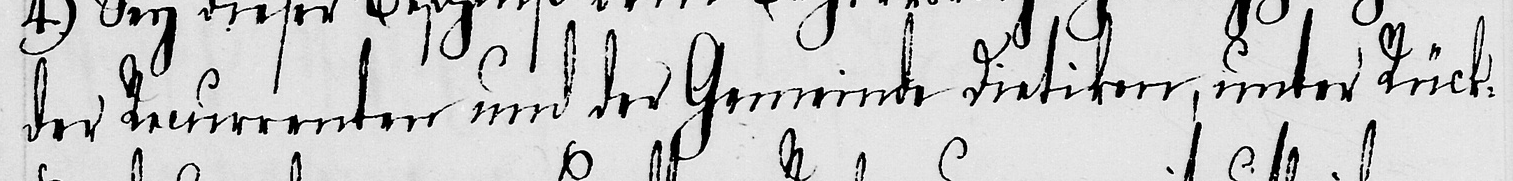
der Recurrenten und der Gemeinde Dietikon, unter Rück¬
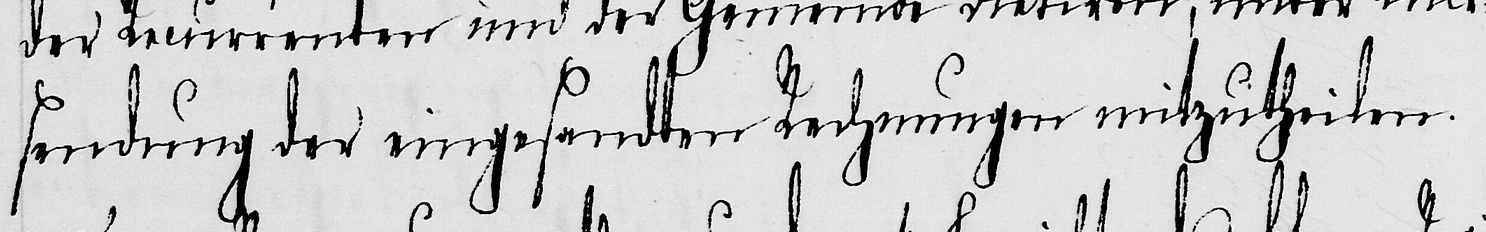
sendung der eingesandten Rechnungen mitzutheilen.
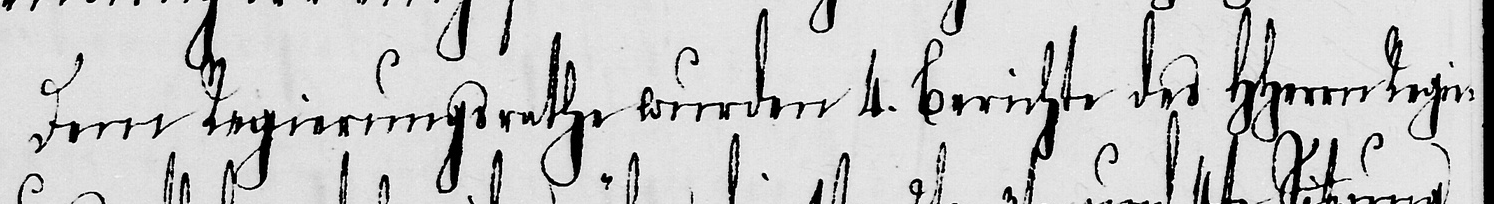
Dem Regierungsrathe wurden 4. Berichte des HHerrn Regi¬
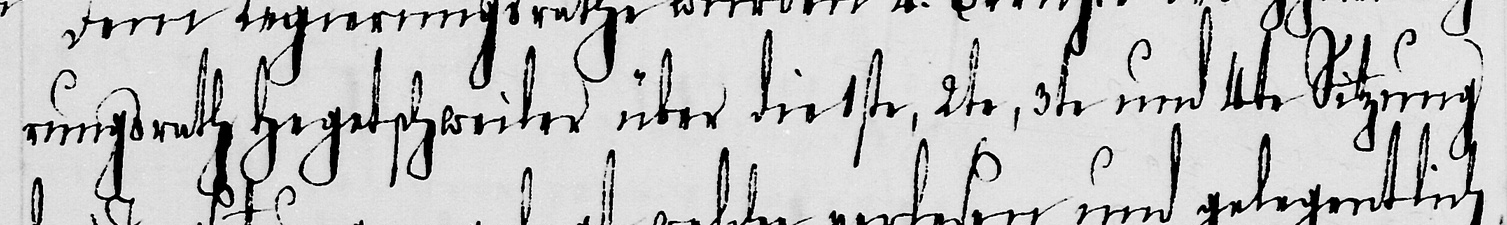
rungsrath Hegetschweiler über die 1ste, 2te, 3te und
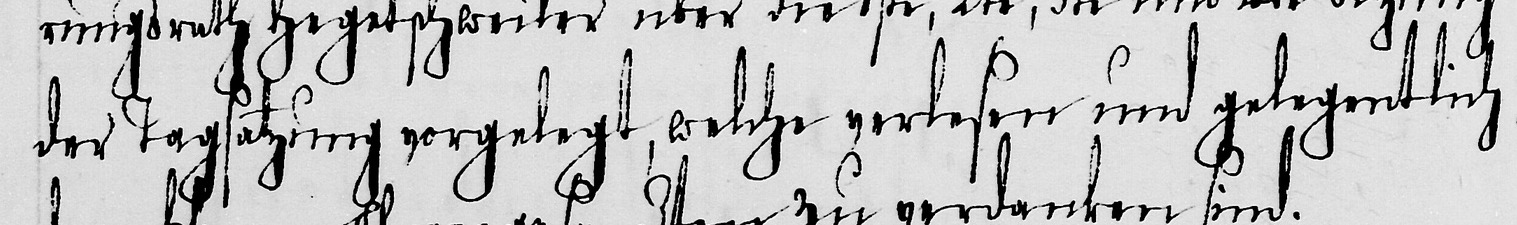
der Tagsatzung vorgelegt, welche verlesen und gelegentlich
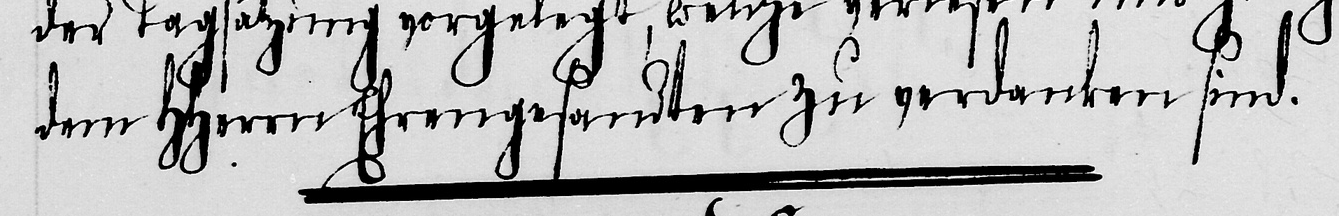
dem HHerrn Ehrengesandten zu verdanken sind.
